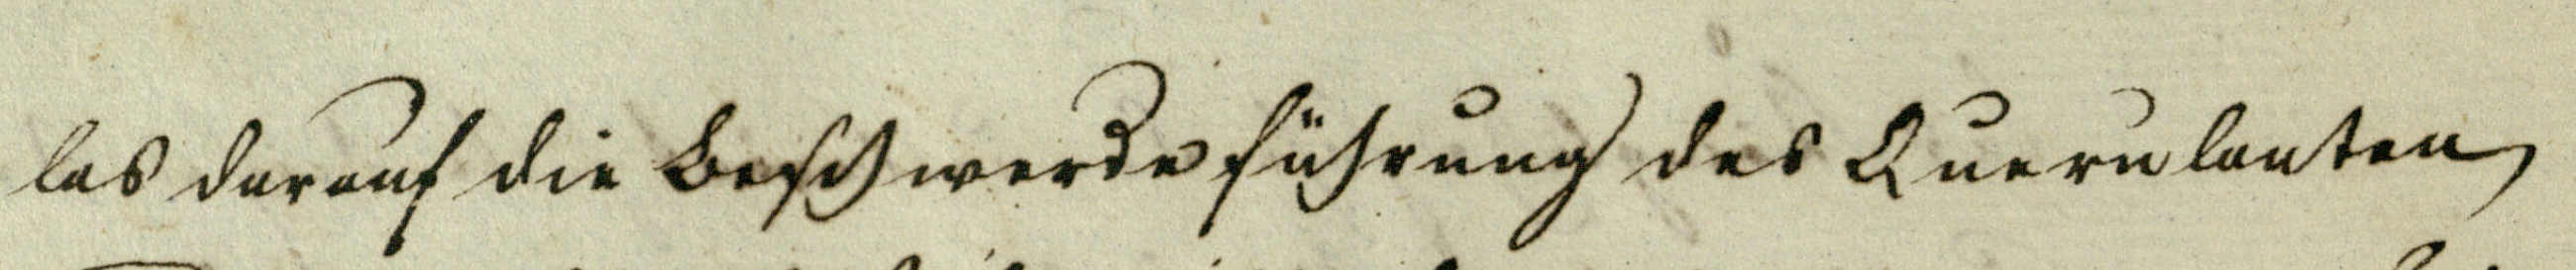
las darauf die Beschwerdeführung das Querulanten
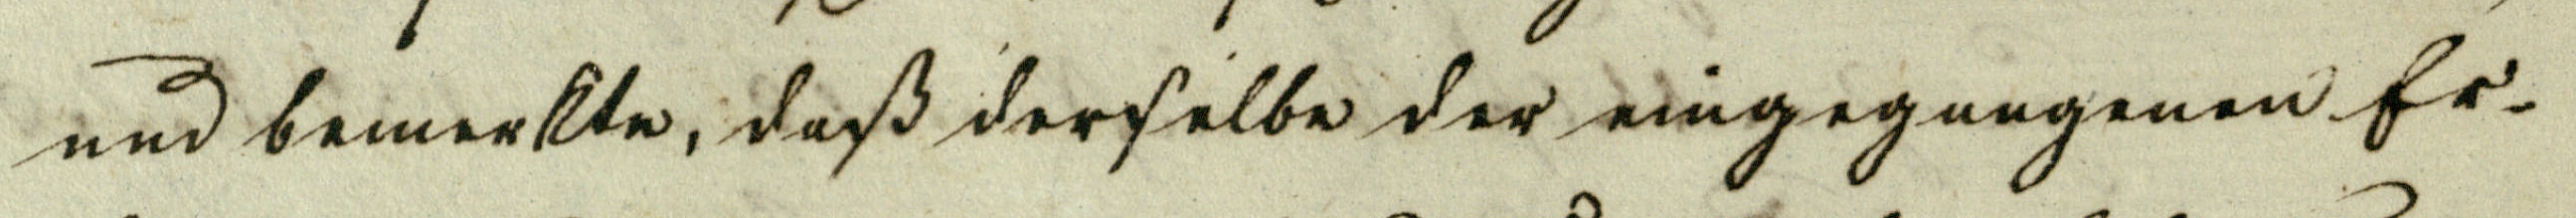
und bemerkte, daß derselbe der eingegangenen Er¬
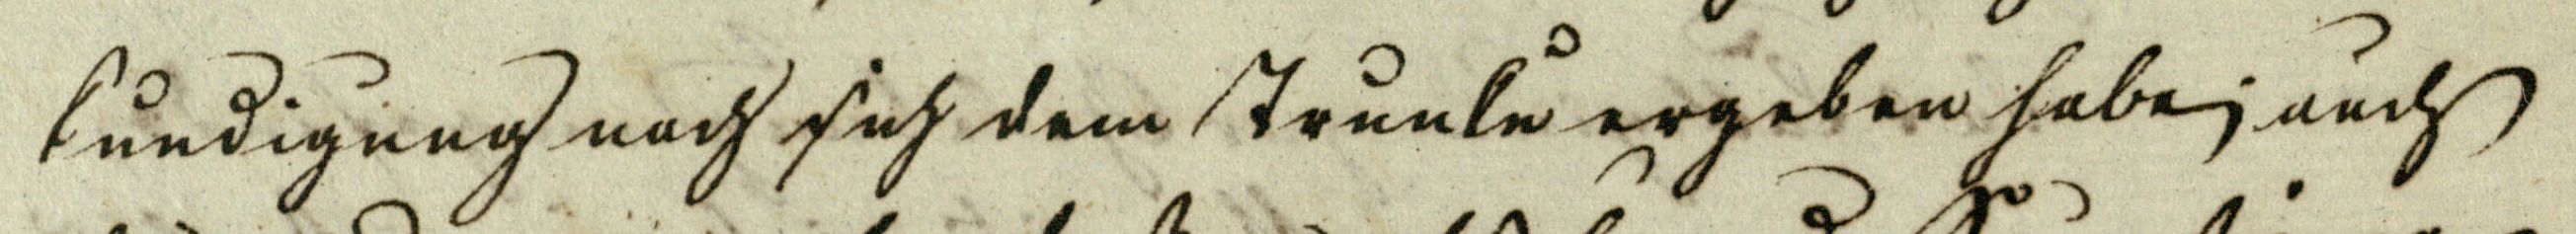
kundigung nach sich dem Trunke ergeben habe, auch
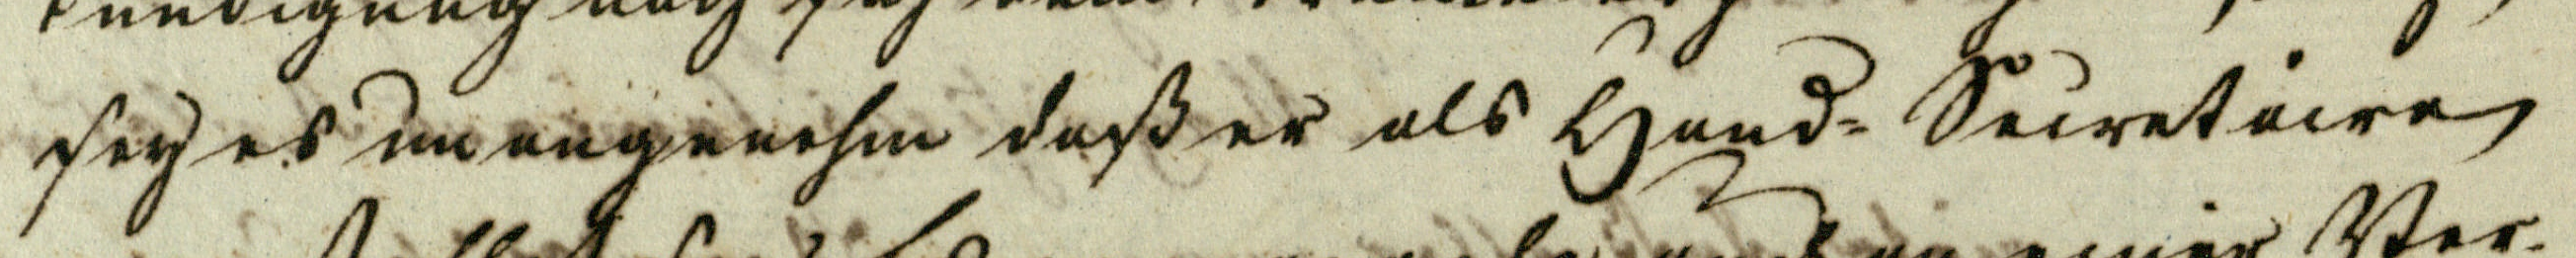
sey es unangenehm, daß er als Hand- Secretaire
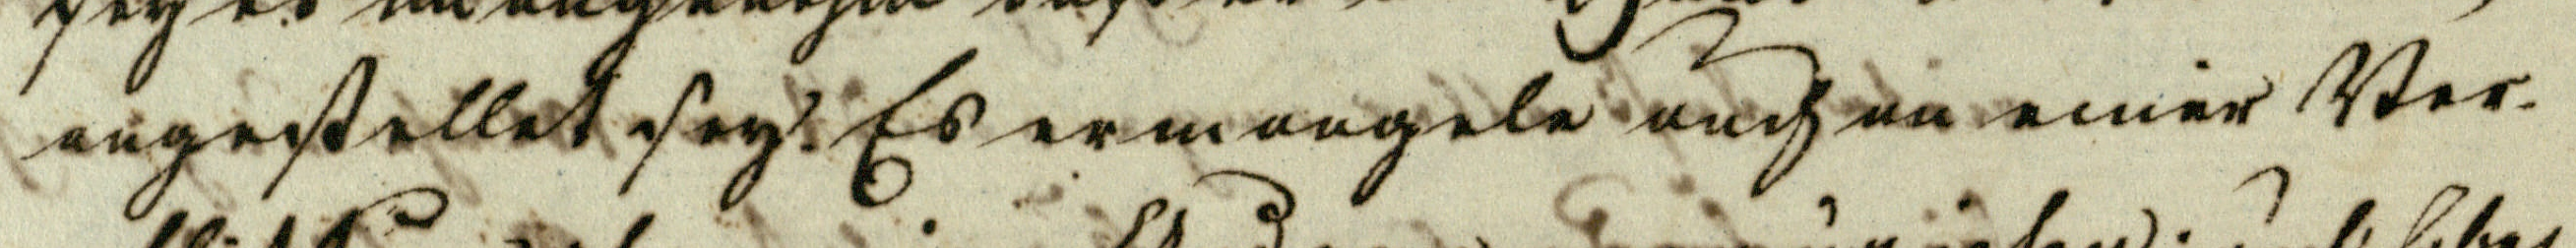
angestellet sey Es ermangele auch an einer Ver¬
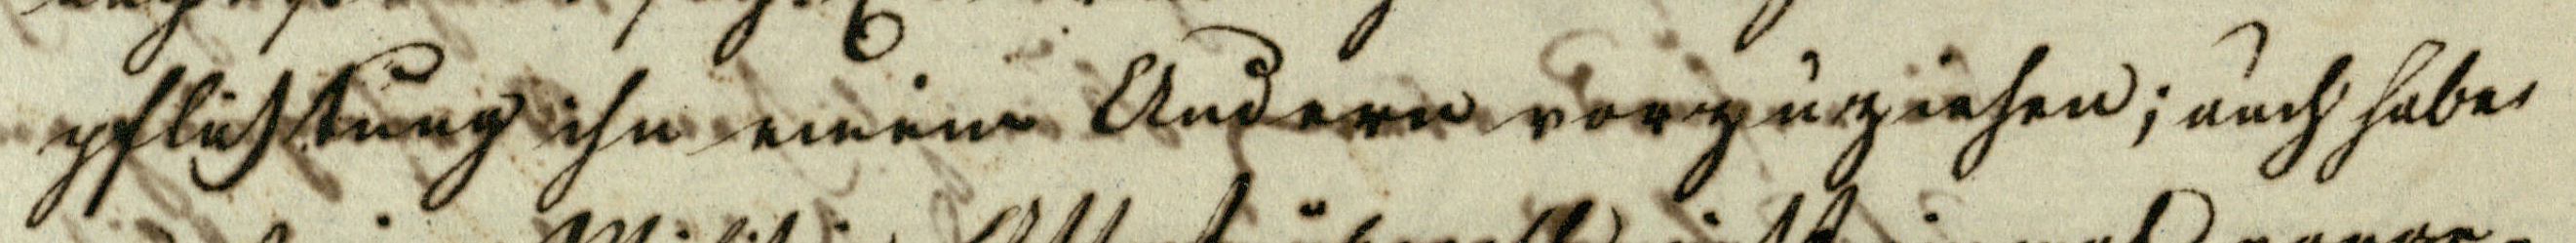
pflichtung ihn einem Andern vorzuziehen; auch habe
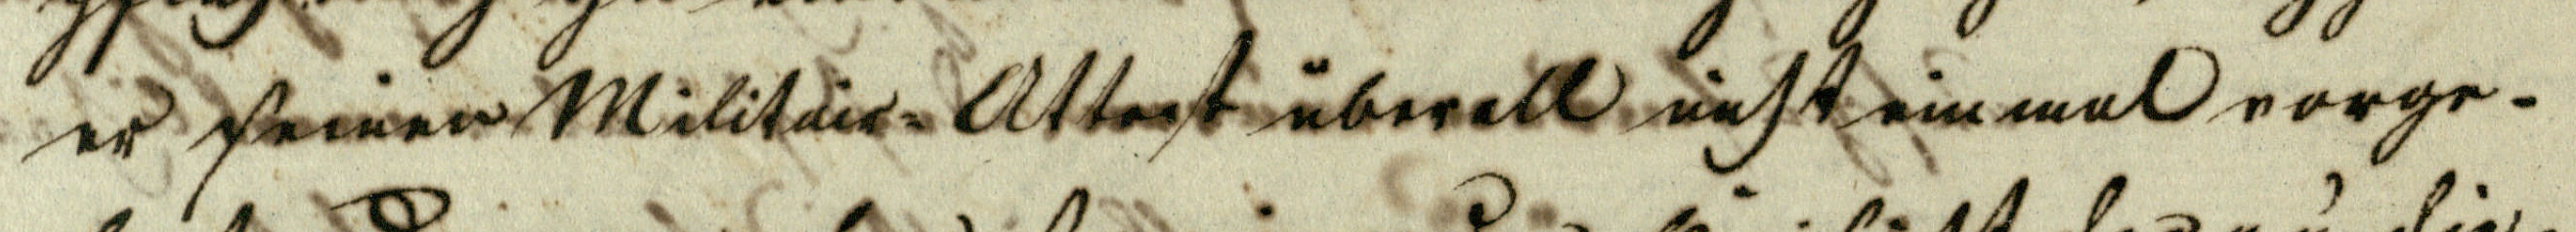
er seinen Militair- Attest überall nicht einmal vorge¬
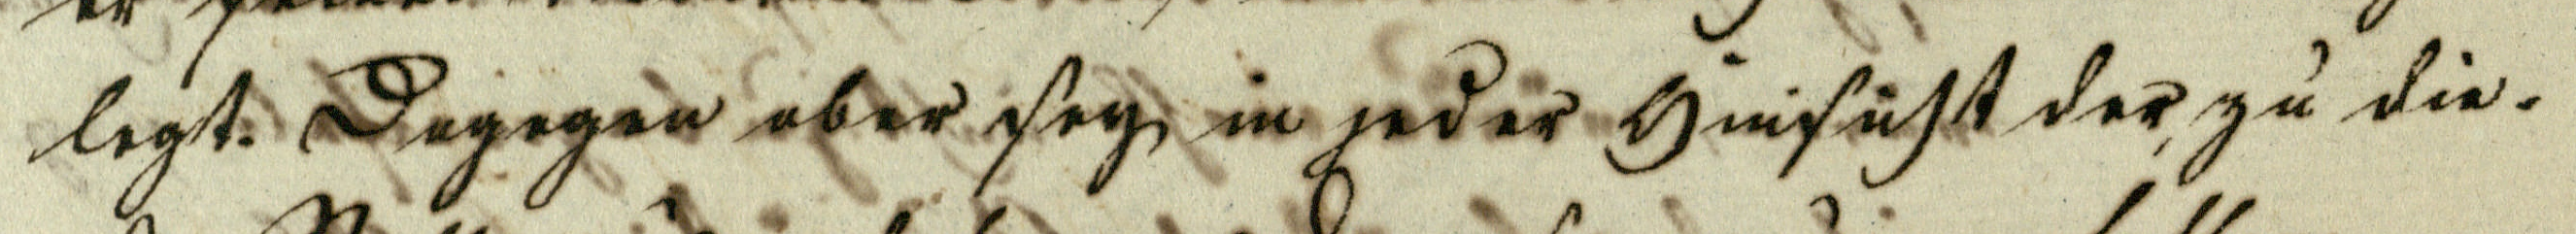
legt. Dagegen aber sey, in der Hinsicht der zu die¬
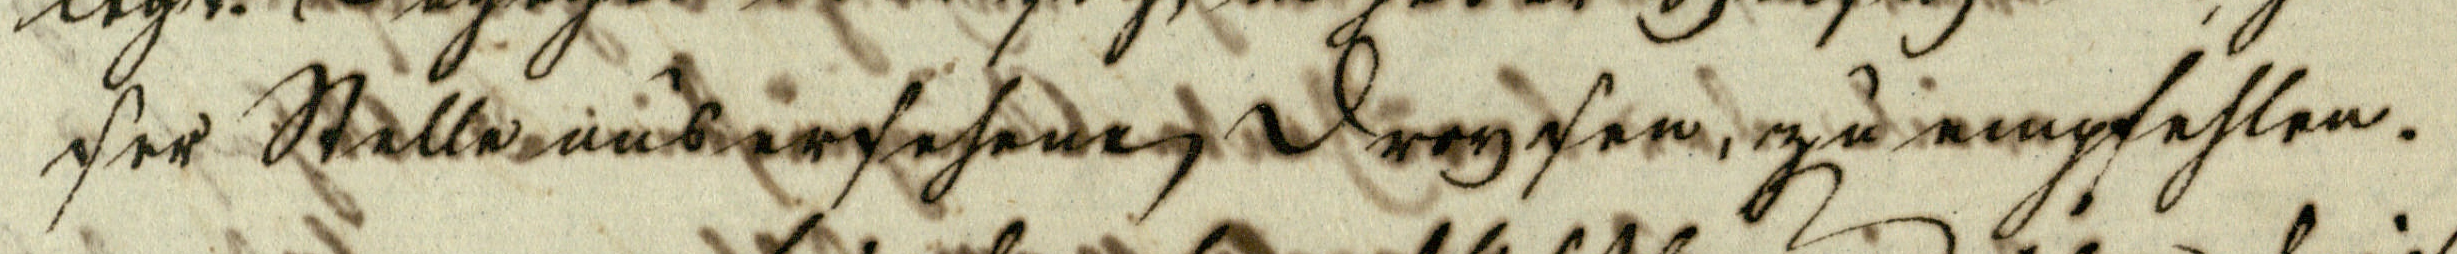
ser Stelle ausersehene Droysen, zu empfehlen.
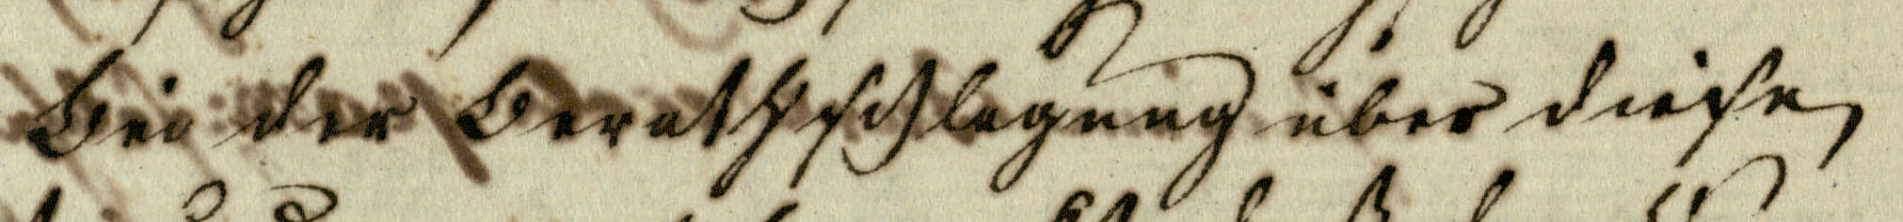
Bei der Berathschlagung über diese,
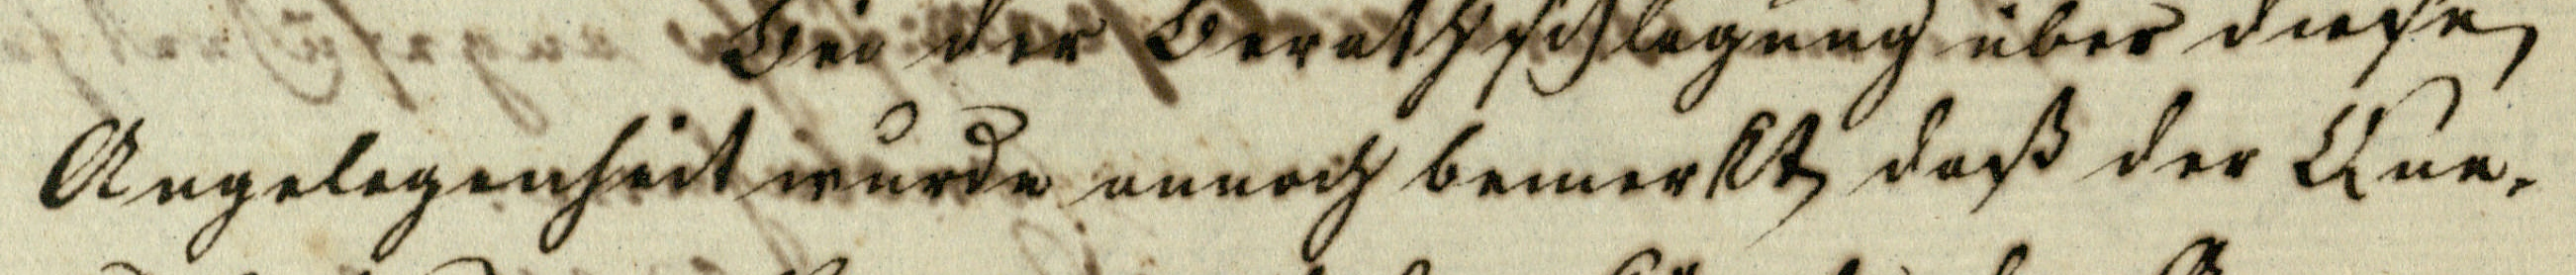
Angelegenheit wurde annoch bemerkt, daß der Que¬
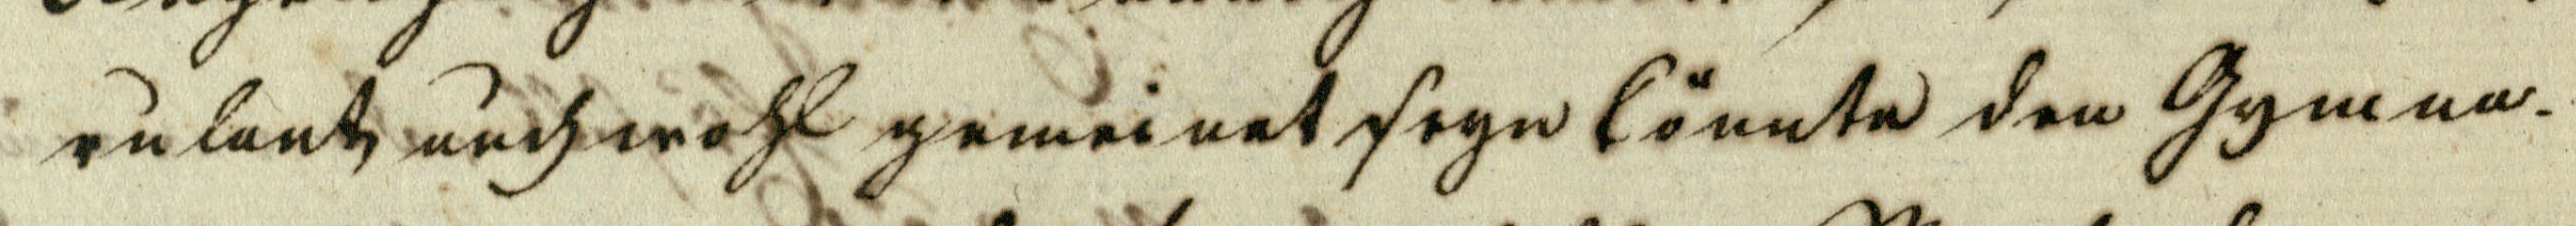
rulant, auch wohl gemeinet seyn könnte den Gymna¬
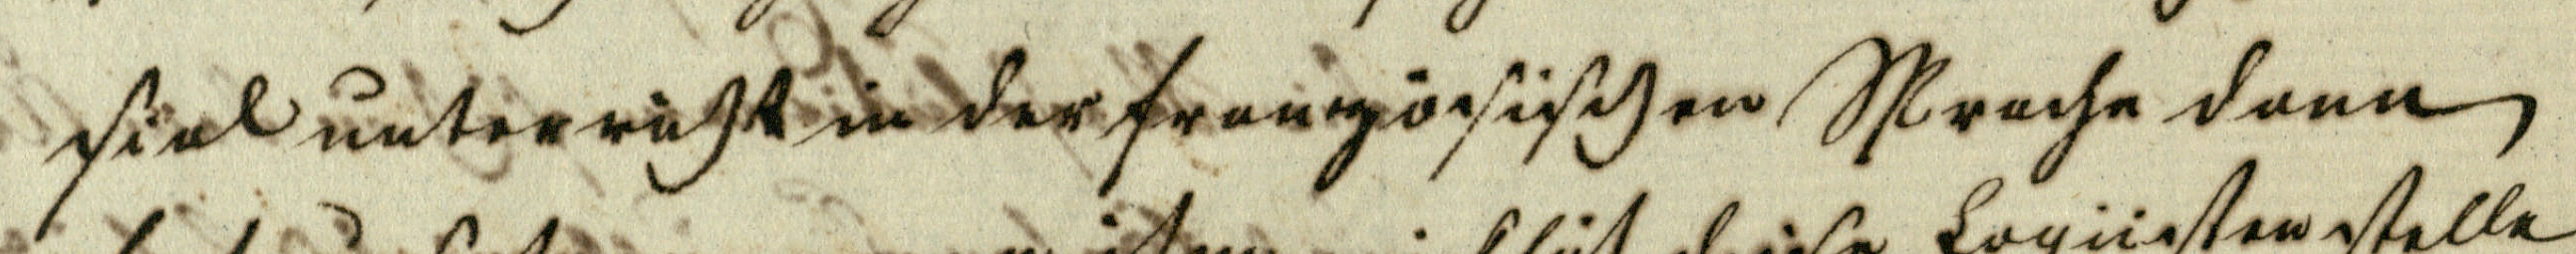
sialunterricht in der französischen Sprache dann
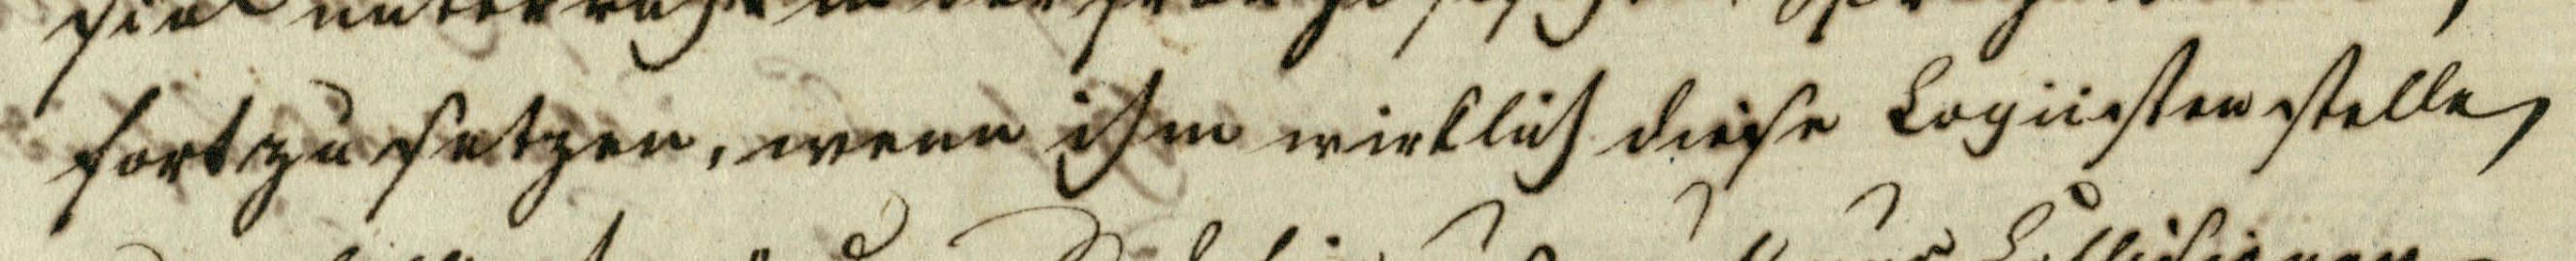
fortzusetzen, wenn ihm wirklich diese Copiistenstelle
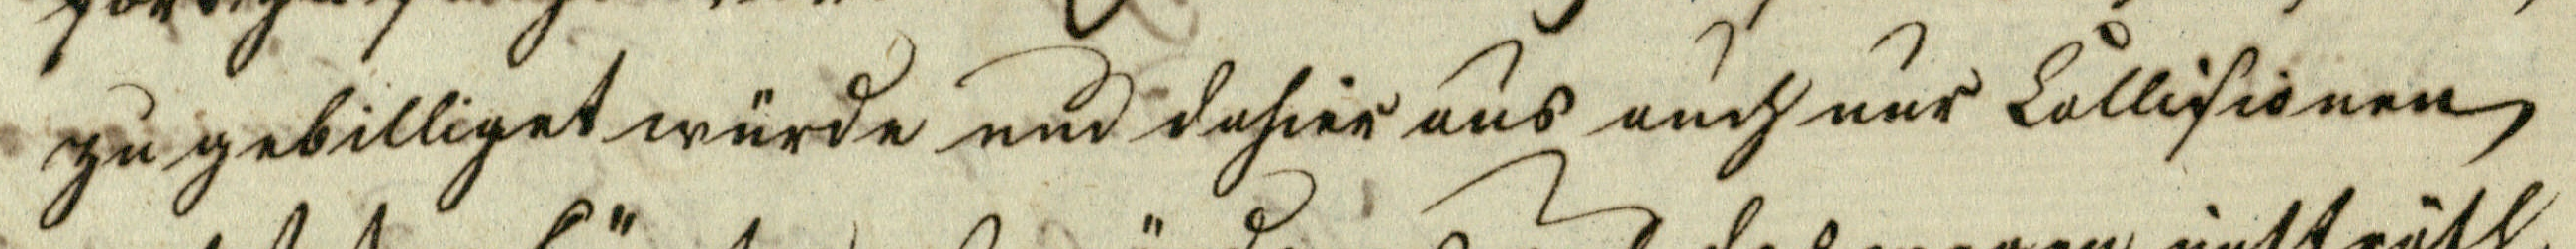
zugebilliget würde und dahier aus auch nur Collisionen
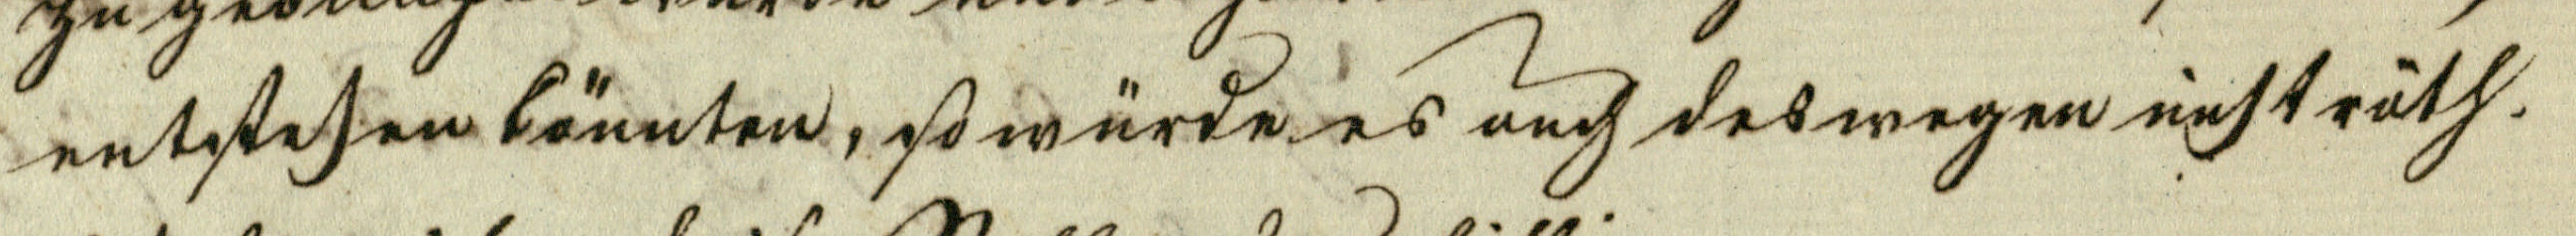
entstehen könnten, so würde es auch deswegen nicht räth¬
